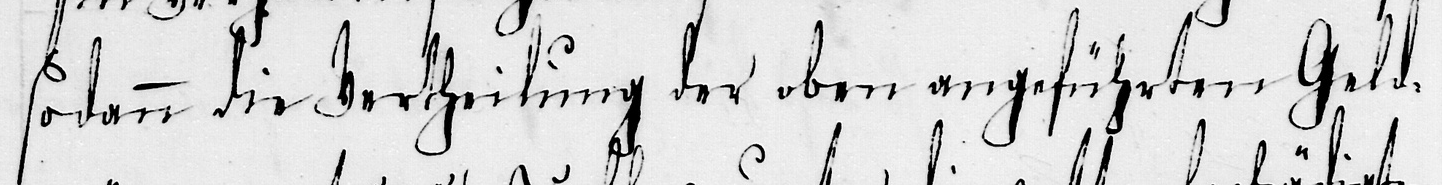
sodann die Vertheilung der oben angeführten Geld¬
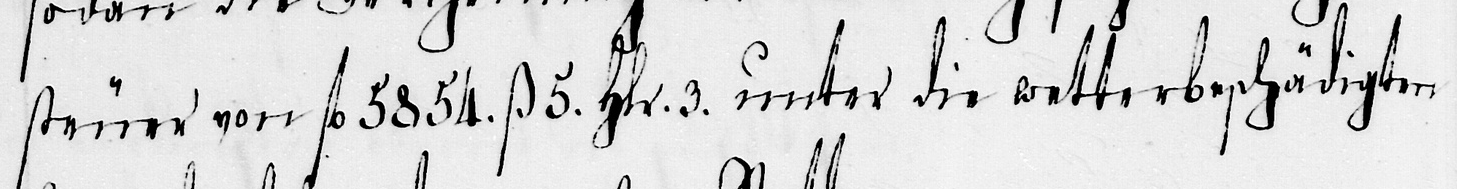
steuer von fl. 5854. ß 5. Hlr. 3. unter die wetterbeschädigten
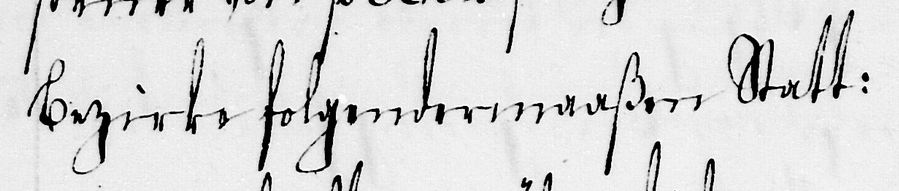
Bezirke folgendermaaßen Statt:
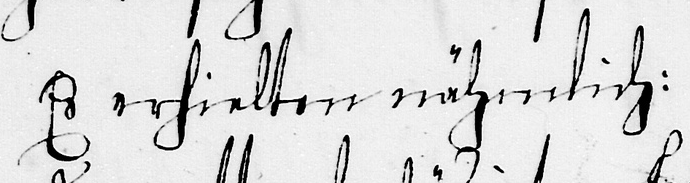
Es erhielten nähmlich:
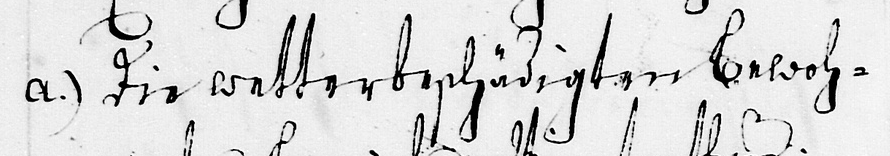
a.) Die wetterbeschädigten Bewoh¬
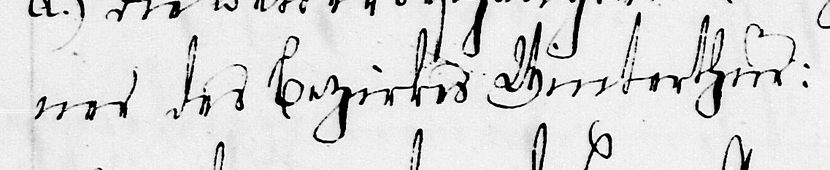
ner des Bezirkes Winterthur:
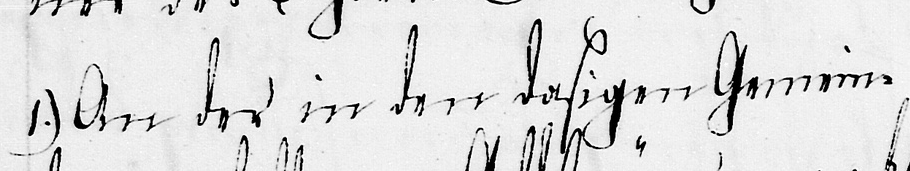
1.) An der in den dasigen Gemein¬
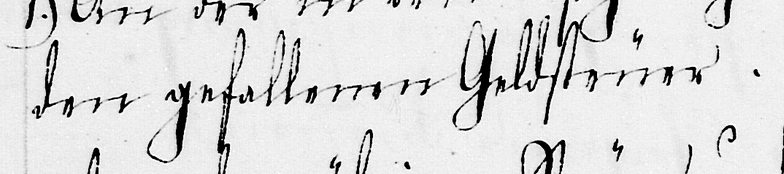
den gefallenen Geldsteuer
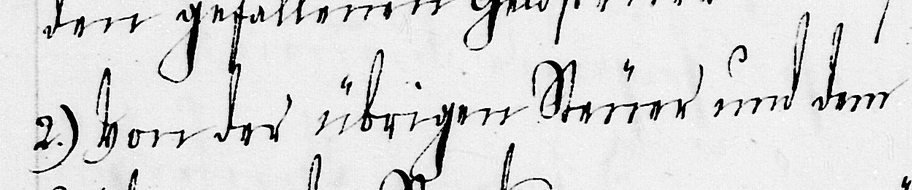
2.) Von der übrigen Steuer und dem
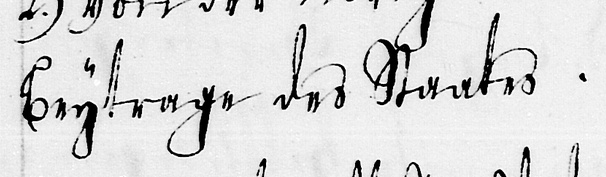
Beytrage des Staates
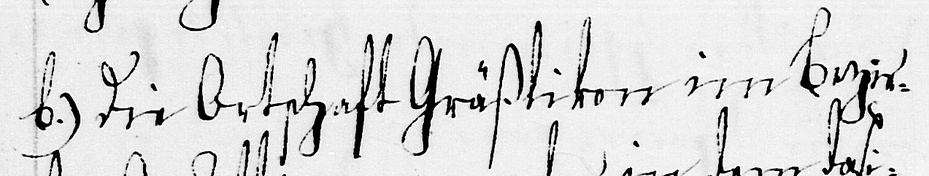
b.) Die Ortschaft Gräßlikon im Bezir¬
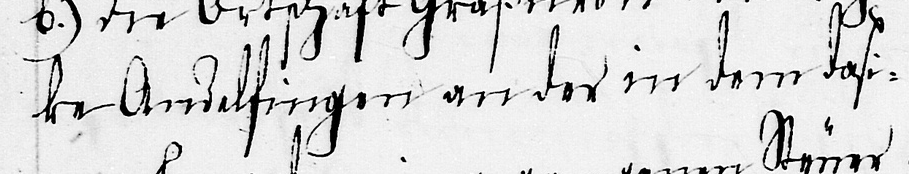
ke Andelfingen an der in dem dasi¬
